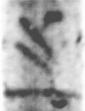之
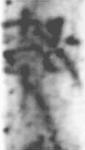○（綴）
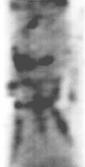兩
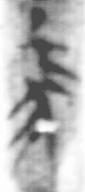馬
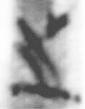之
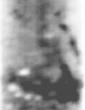革
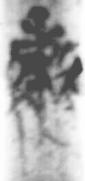○（轡）
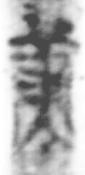黃
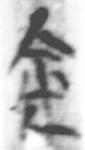金
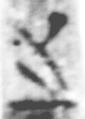之
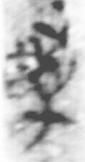勒
